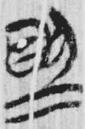則（則）
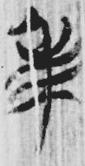民
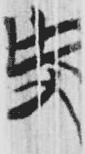拃（作）
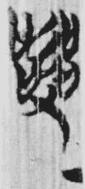○（亂）
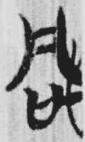○（凡）
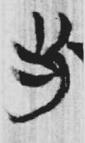此
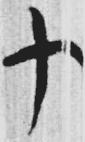七
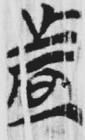者
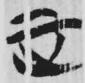正（政）
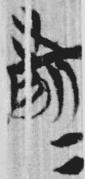之所
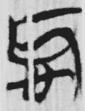怠（殆）
